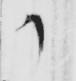人
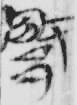○（殷）
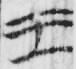王
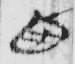西
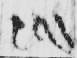州
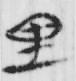里
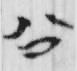公
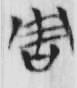周
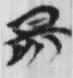昜（陽）
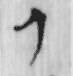人
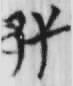邗
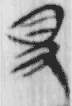○（得）
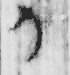人
